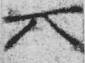亓（其）
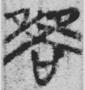○（鄰）
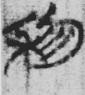利
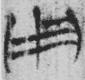用
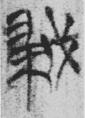○（侵）
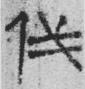伐
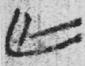亡
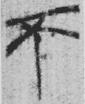不
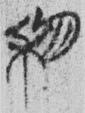利
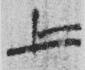上
